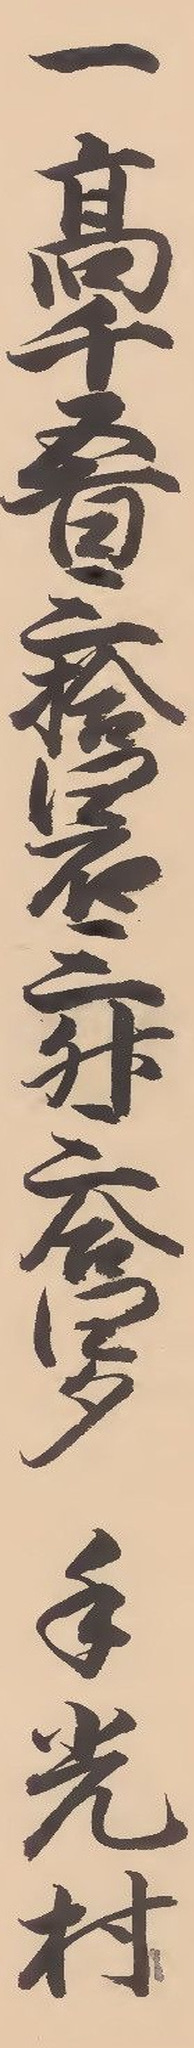一高千五百三拾四石三升三合四勺手光村
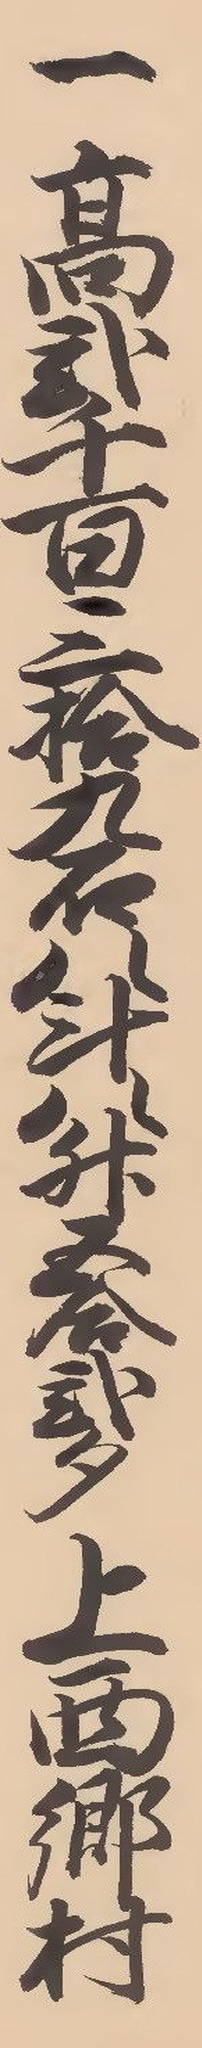一高弐千百三拾九石八斗八升五合弐勺上西郷村
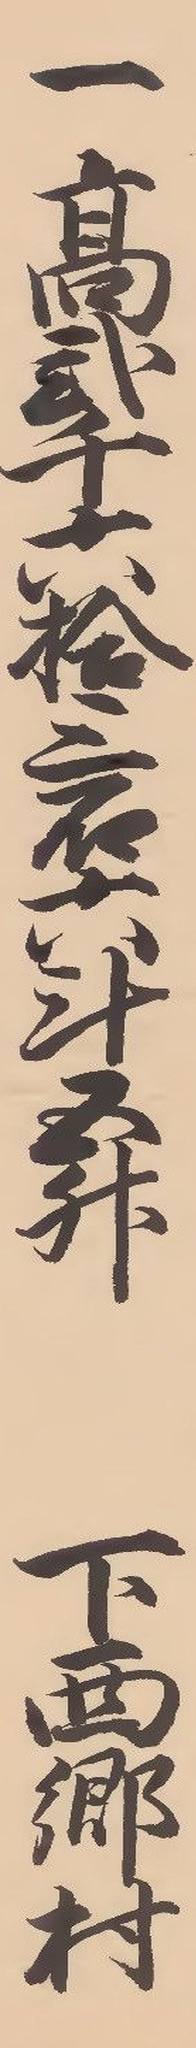一高弐千六拾三石六斗五升下西郷村
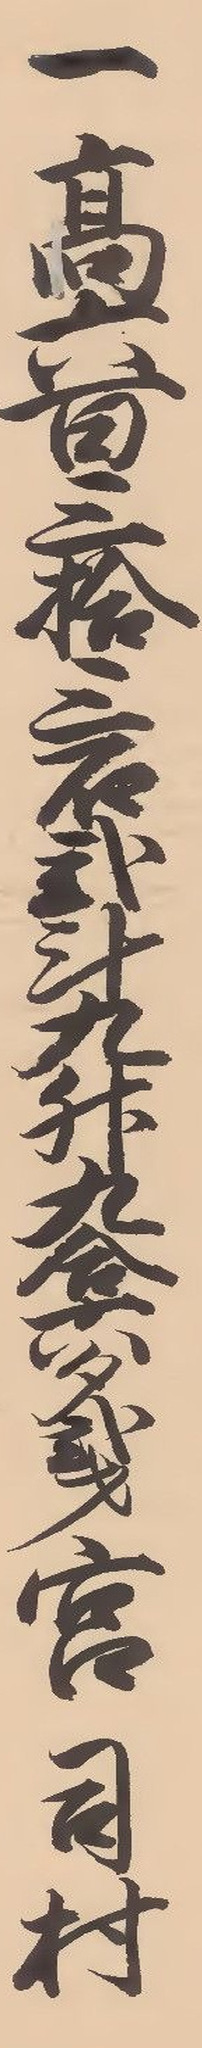一高六百三拾三石弐斗九升九合六勺弐才宮司村
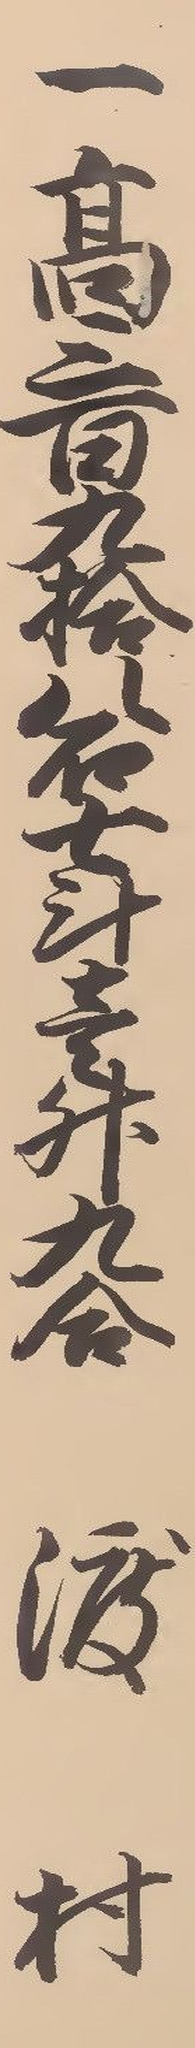一高三百九拾八石七斗壱升九合渡村
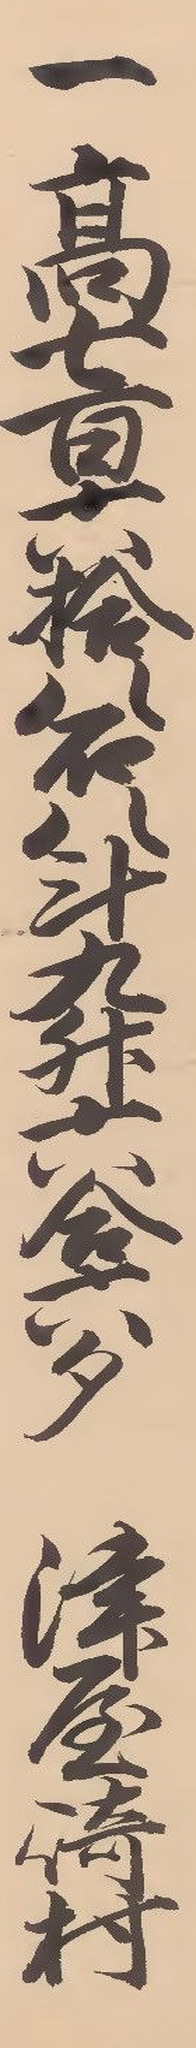一高七百六拾八石八斗九升六合六勺津屋崎村
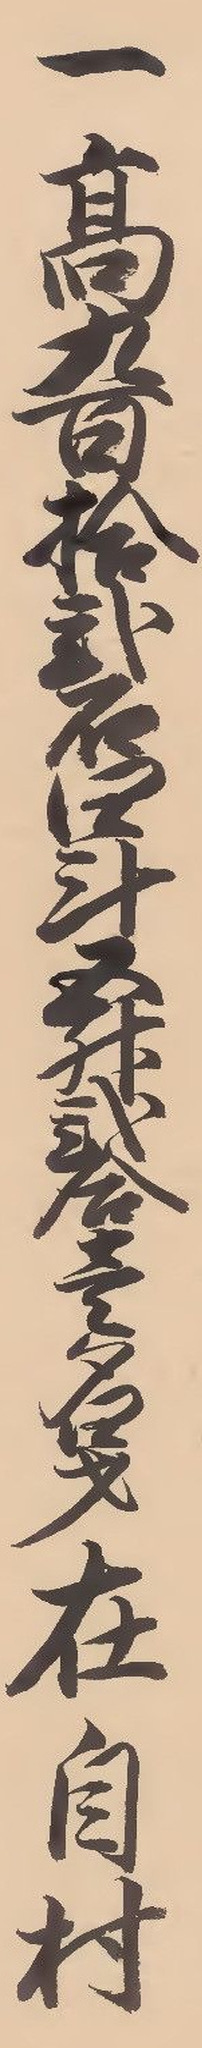一高九百拾弐石四斗五升弐合壱勺四才在自村
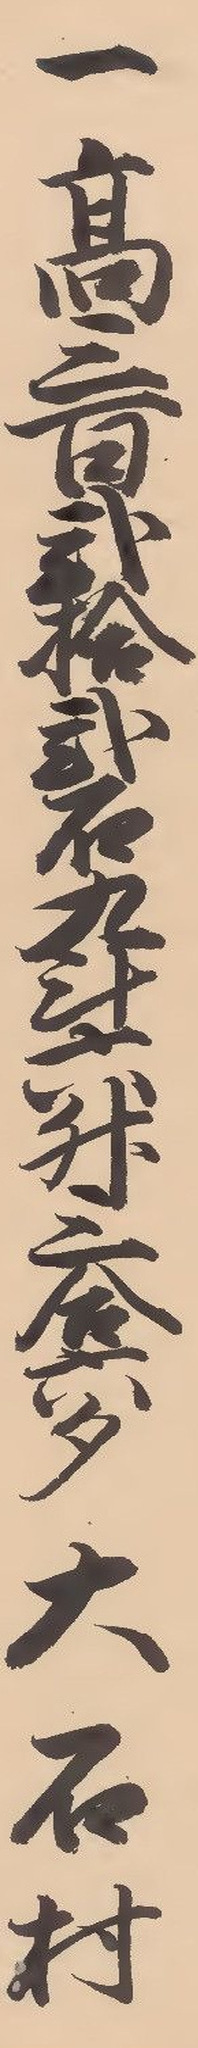一高三百弐拾弐石九斗六升三合六勺大石村

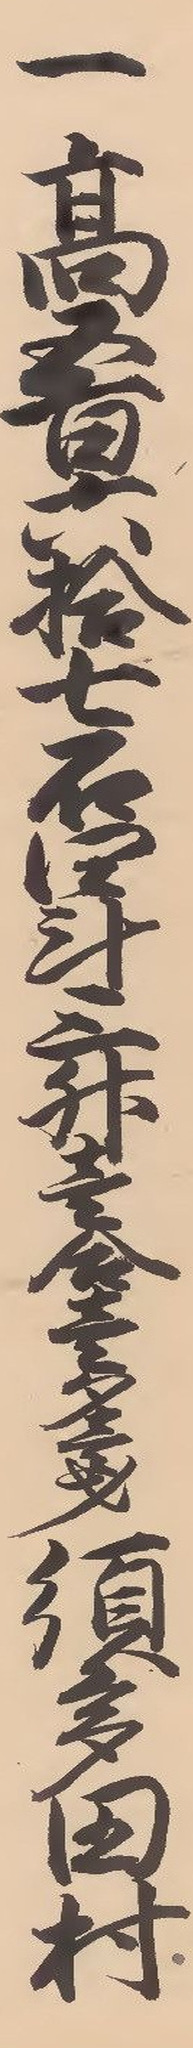一高五百六拾七石四斗三升壱合壱勺壱才須多田村
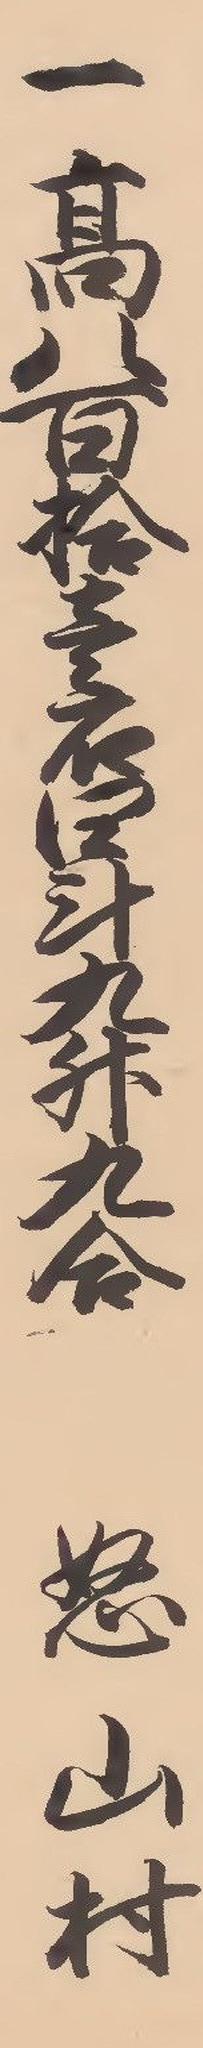一高八百拾壱石四斗九升九合怒山村
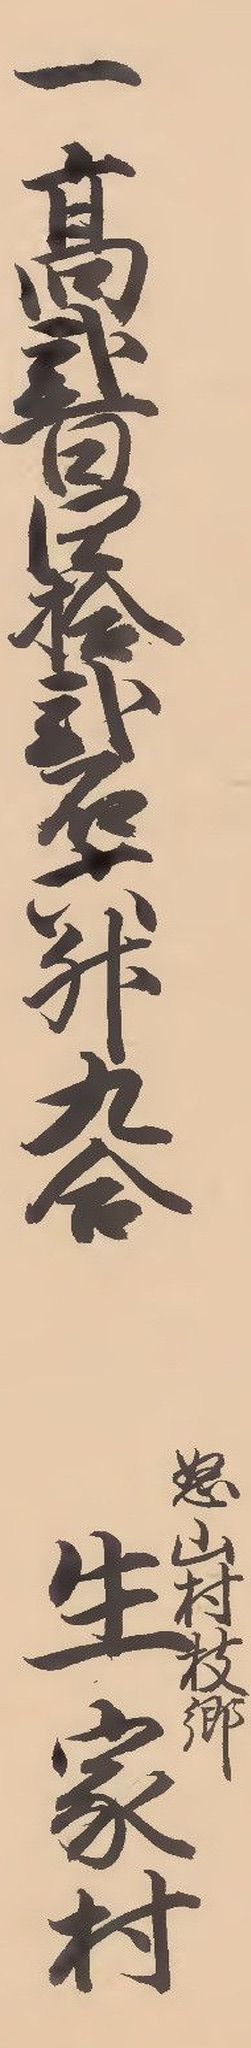一高弐百四拾五石五升九合江口村
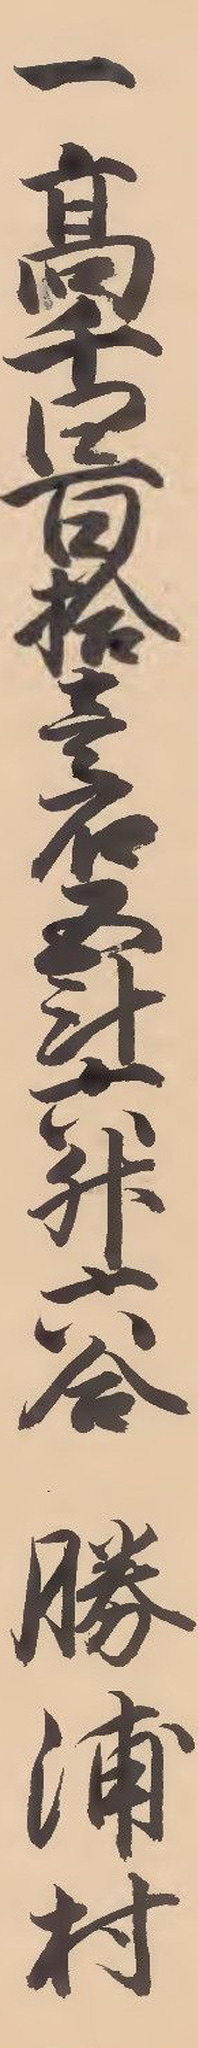一高千四百拾壱石五斗六升六合勝浦村
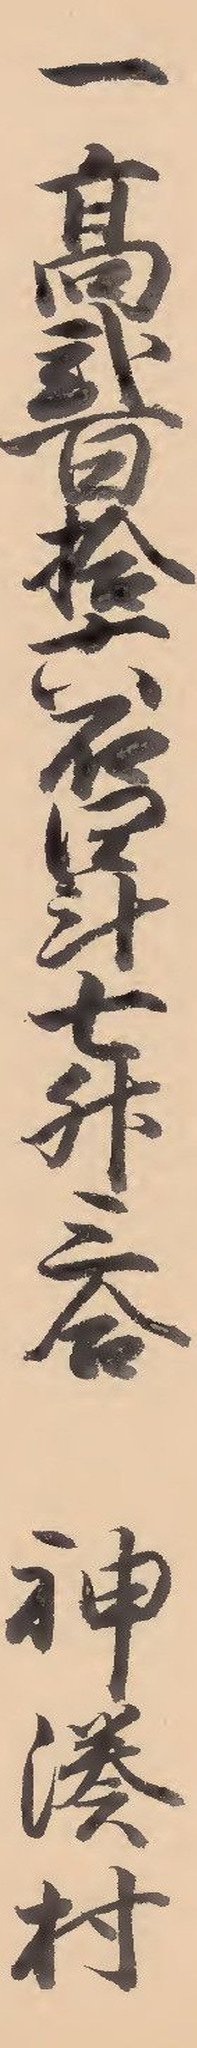一高弐百拾六石四斗七升三合神湊村
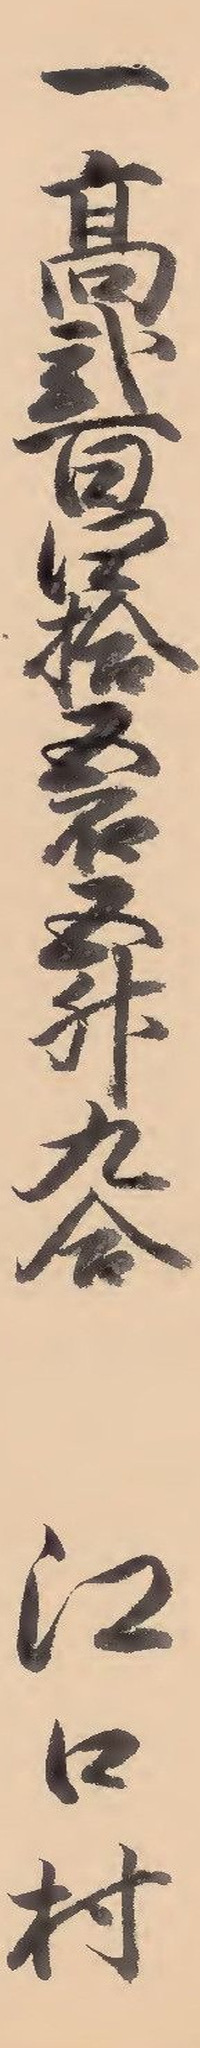一高弐百四拾五石五升九合江口村
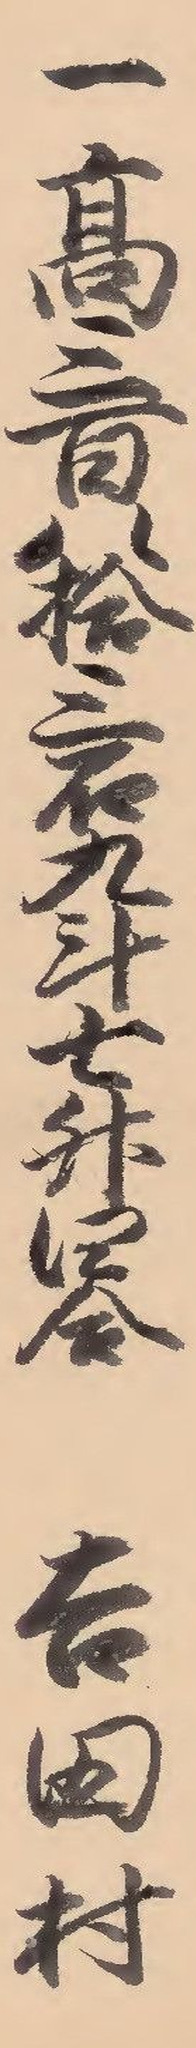一高三百八拾三石九斗七升四合吉田村

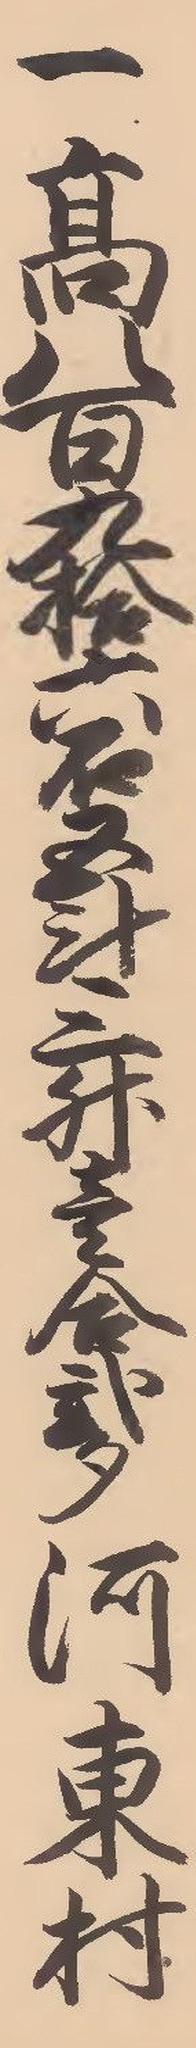一高八百九拾六石五斗三升壱合弐勺河東村
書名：筑前国郷帳
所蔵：国立公文書館 National Archives of Japan
